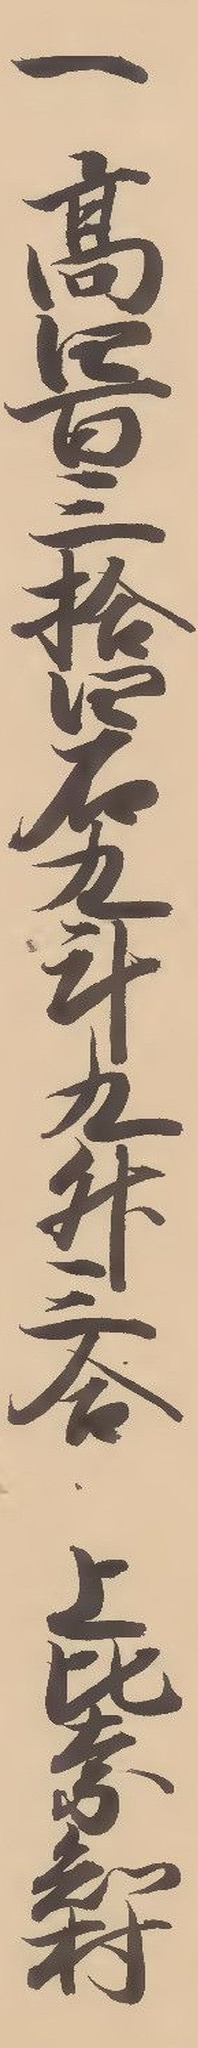一高四百三拾四石九斗九升三合上比奈知村
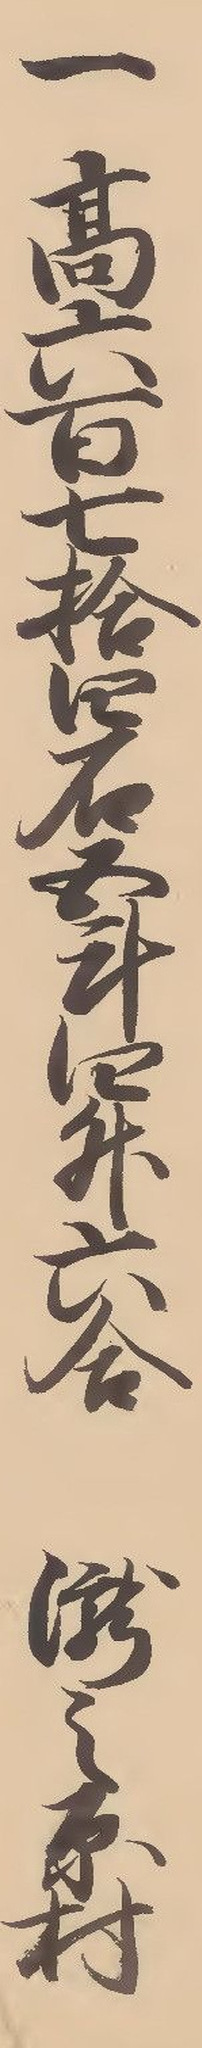一高六百七拾四石五斗四升六合滝之原村
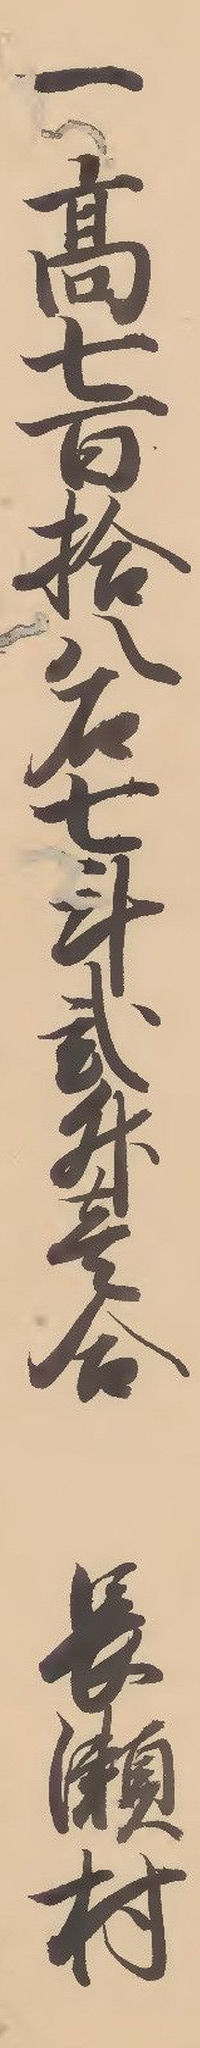一高七百拾八石七斗弐升壱合長瀬村

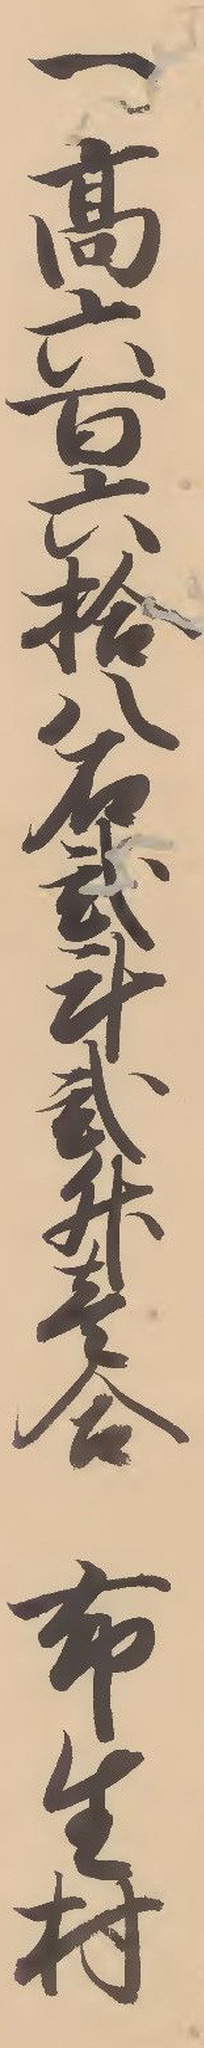一高六百六拾八石弐斗弐升壱合布生村
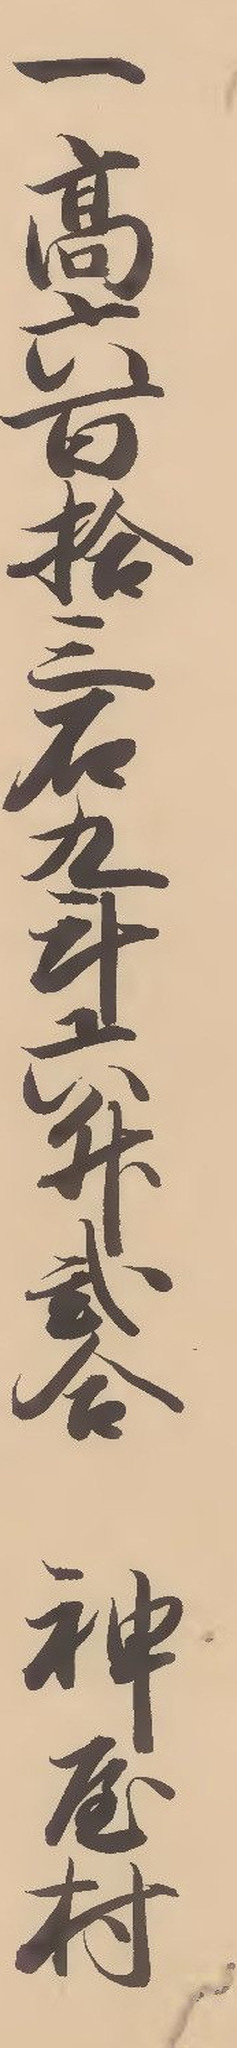一高六百拾三石九斗六升弐合神屋村
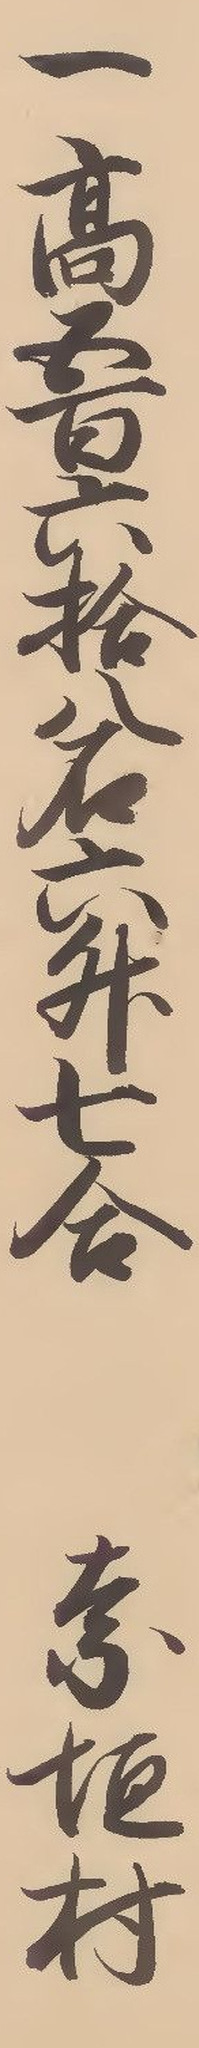一五百六拾八石六升七合奈垣村
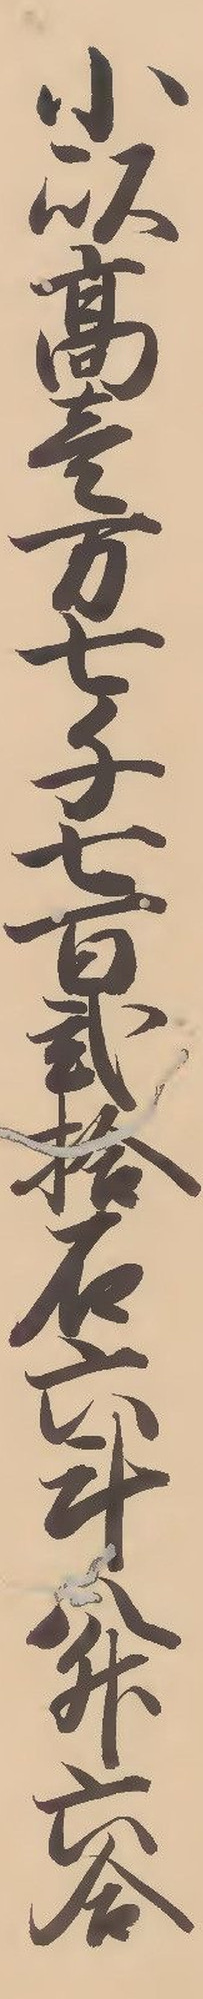小以高壱万七千七百弐拾石六斗八升六合
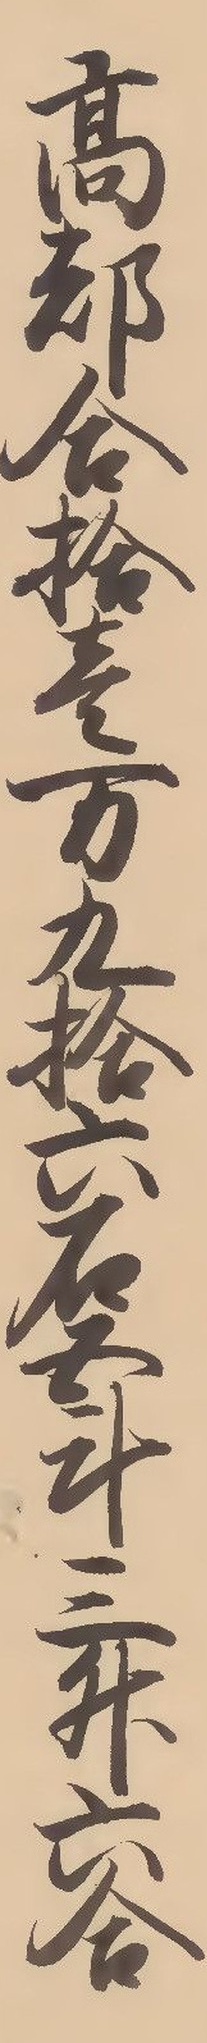高都合拾壱万九拾六石五斗三升六合
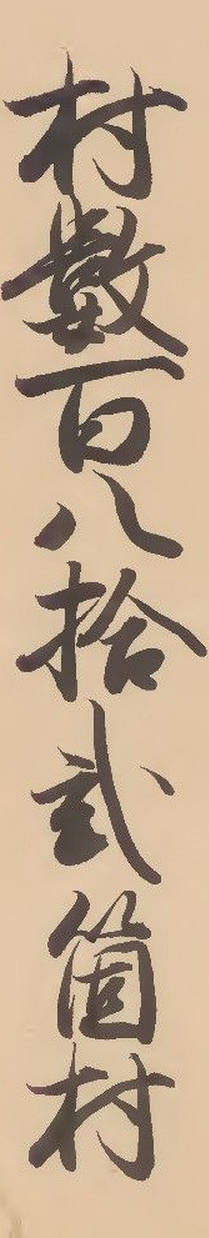村数百八拾弐箇村

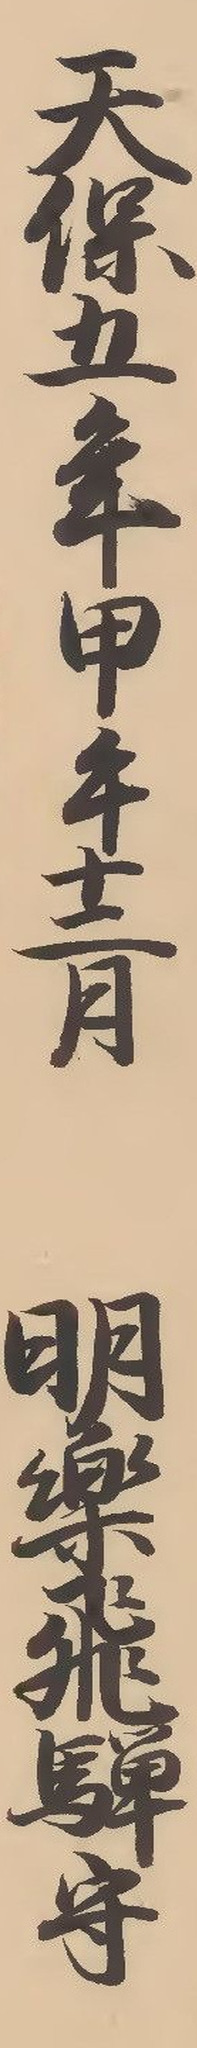天保五年甲午十二月明楽飛騨守
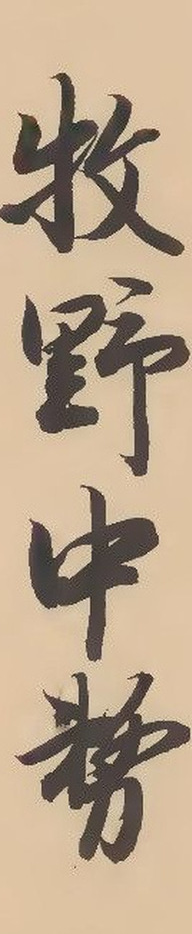牧野中務
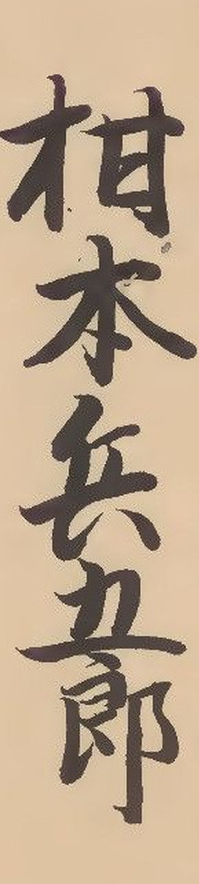柑本兵五郎
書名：伊賀国郷帳
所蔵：国立公文書館 National Archives of Japan
